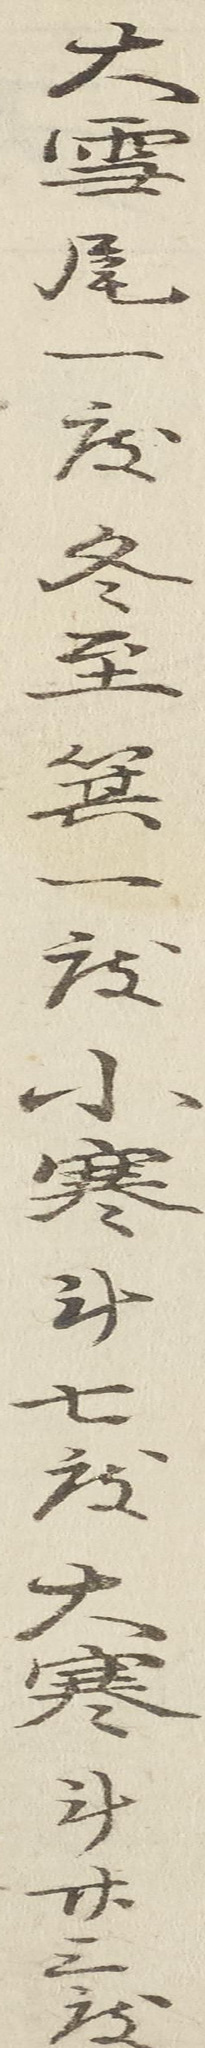大雪尾一度冬至箕一度小寒斗七度大寒斗廿三度
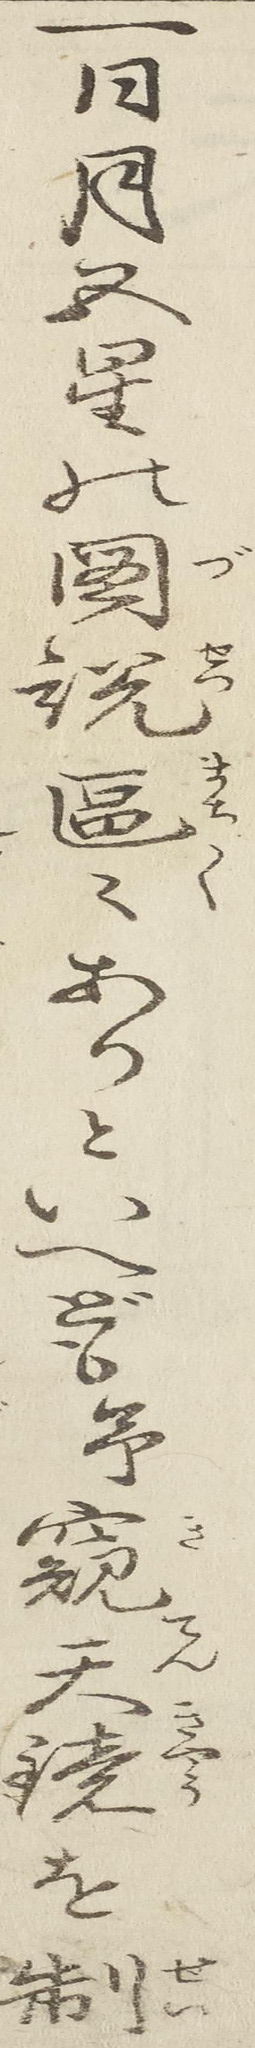一日月五星の図説区々ありといへども予窺天鏡を制
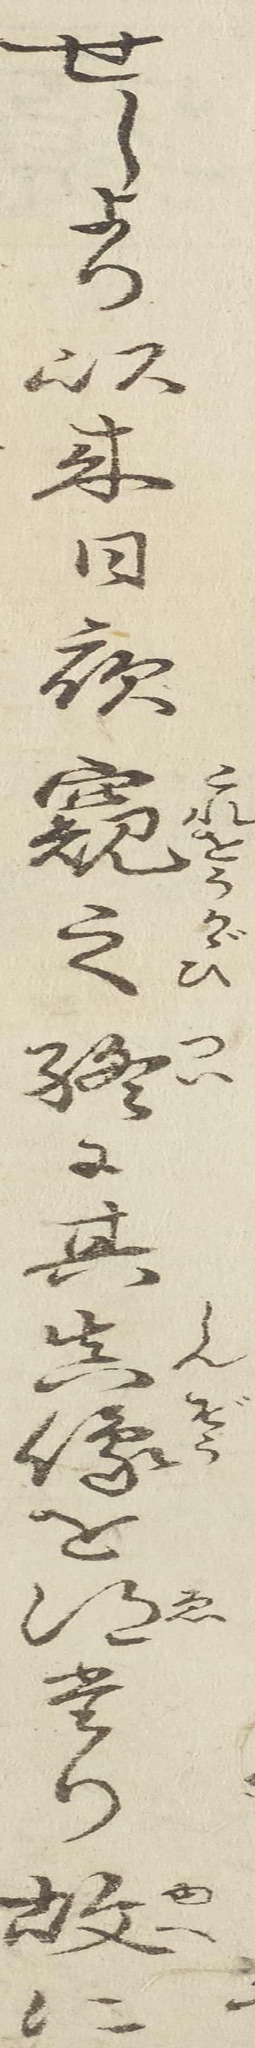せしより以来日夜窺之終に其真像を得たり故に
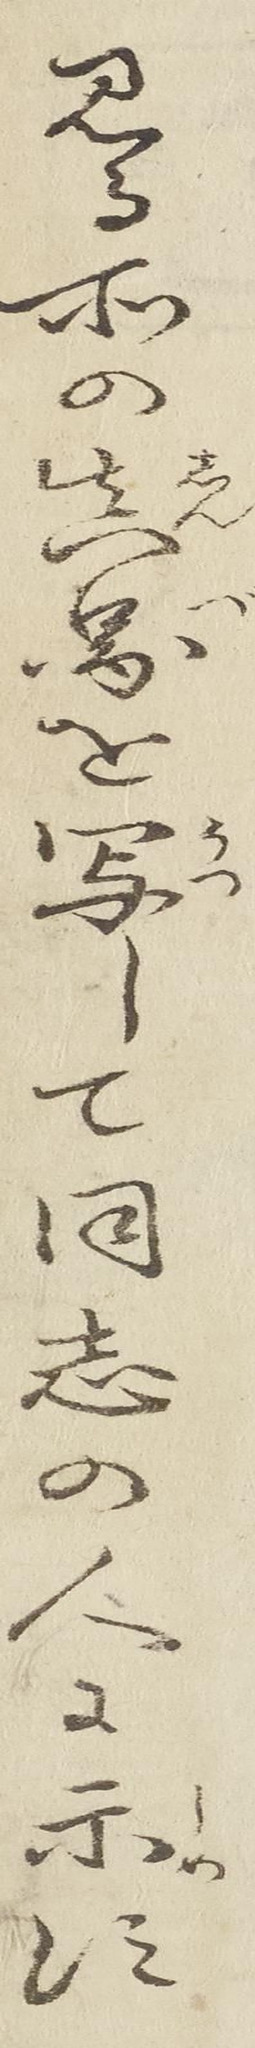見る所の真図を写して同志の人に示す

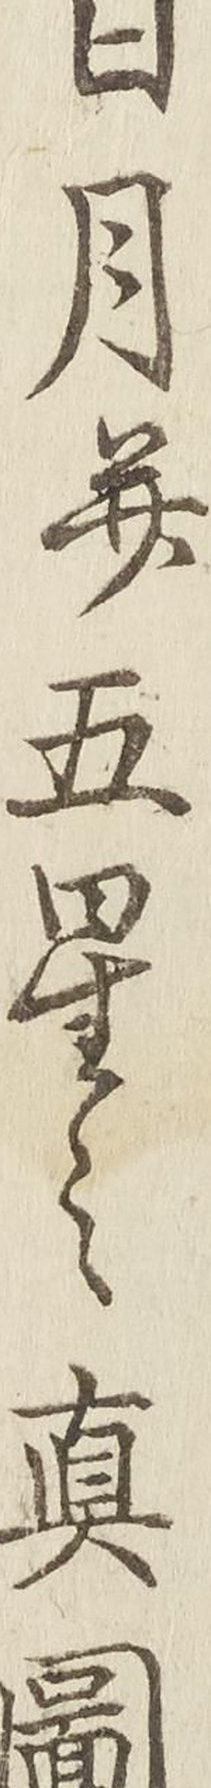日月幷五星之真図
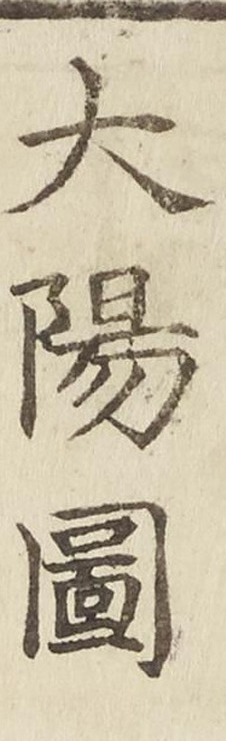大陽図
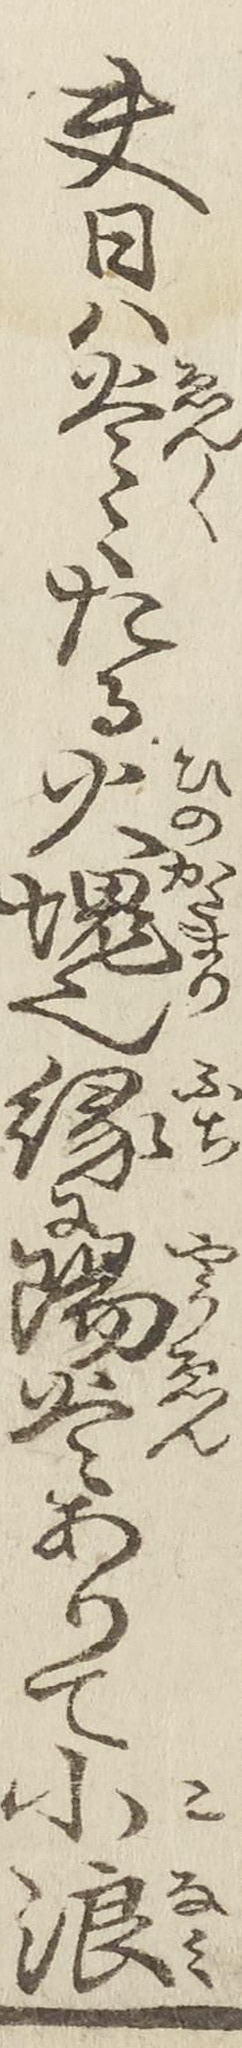夫日は炎々たる火塊也縁に陽炎ありて小浪
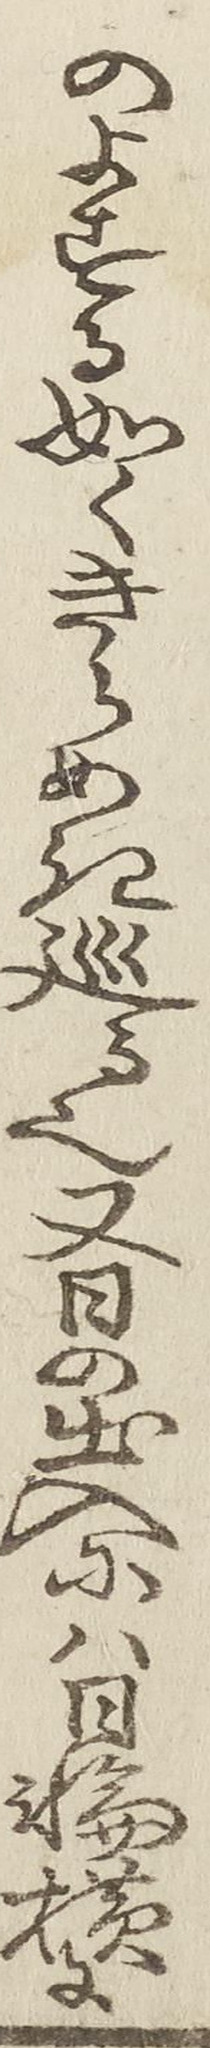のよする如くきらめき巡る也又日の出入には日輪横に
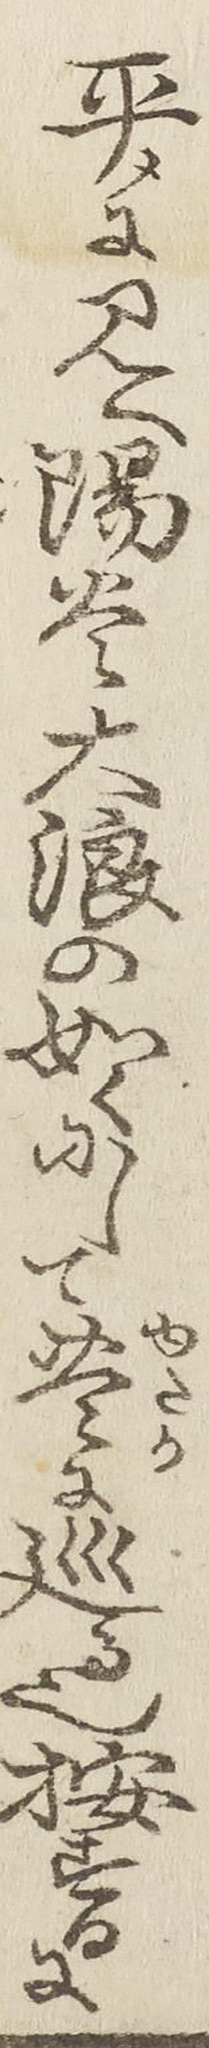平メに見へ陽炎大浪の如くにして豊に巡る也按するに
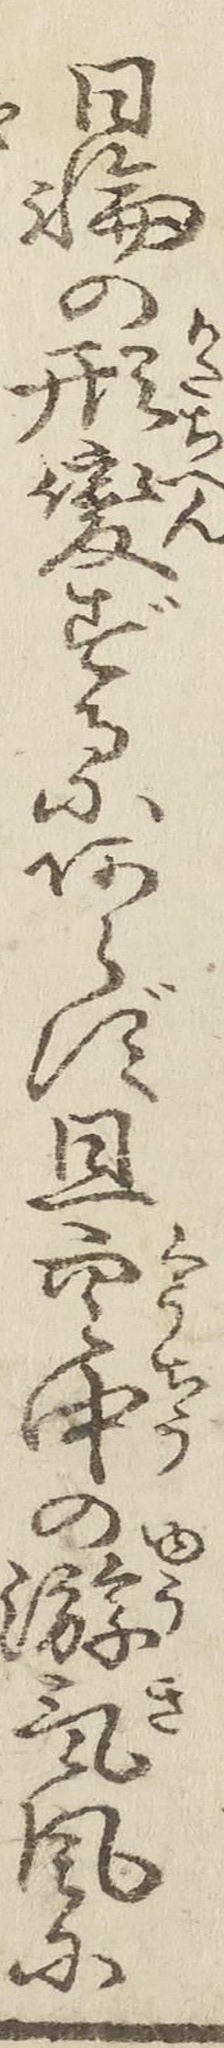日輪の形変ずるにあらず且空中の游気風に
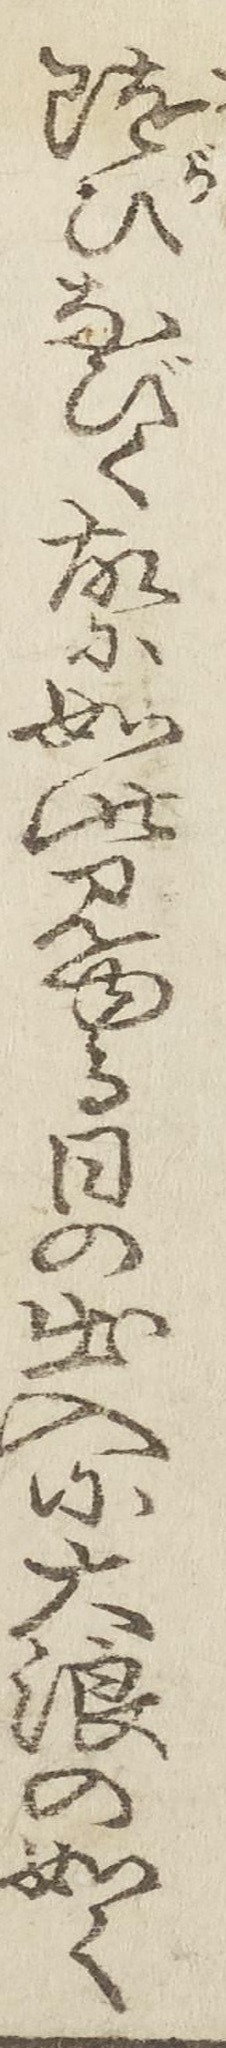随ひなびく故に如此見ゆる日の出入に大浪の如く
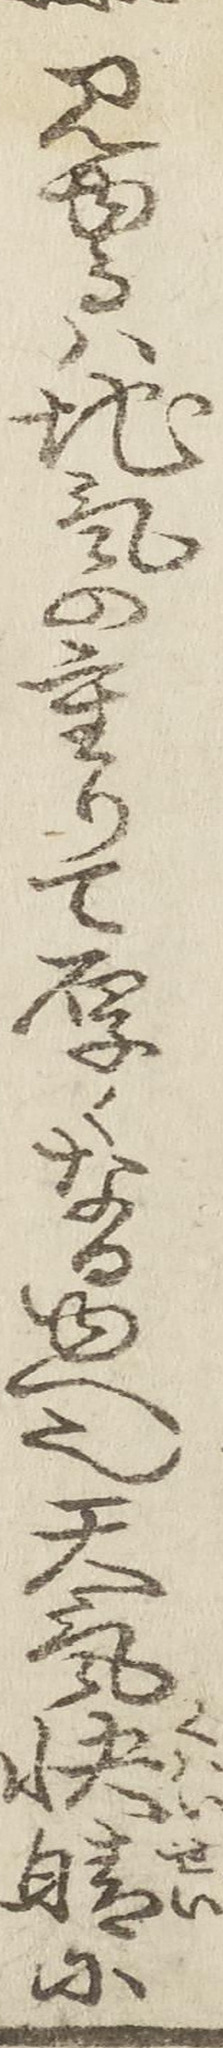見ゆるは地気の重りて厚くなるゆへ也天気快晴に
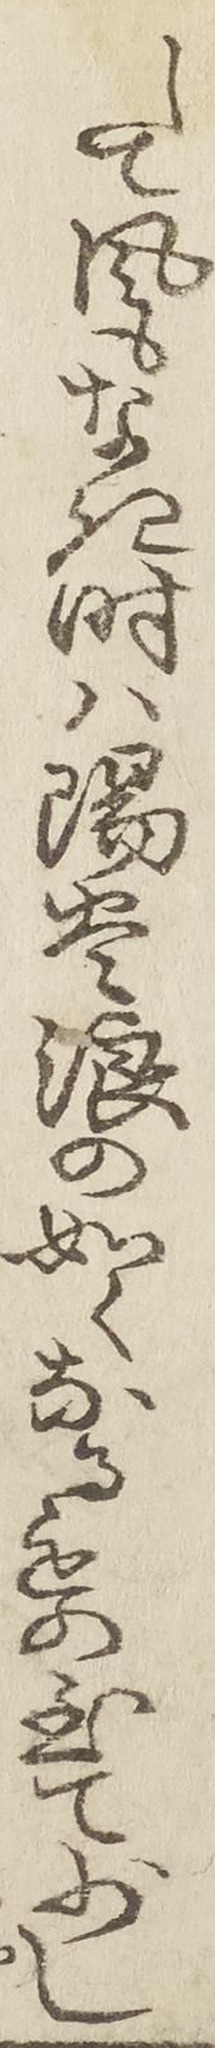して風もなき時は陽炎浪の如くなるもの至て少し
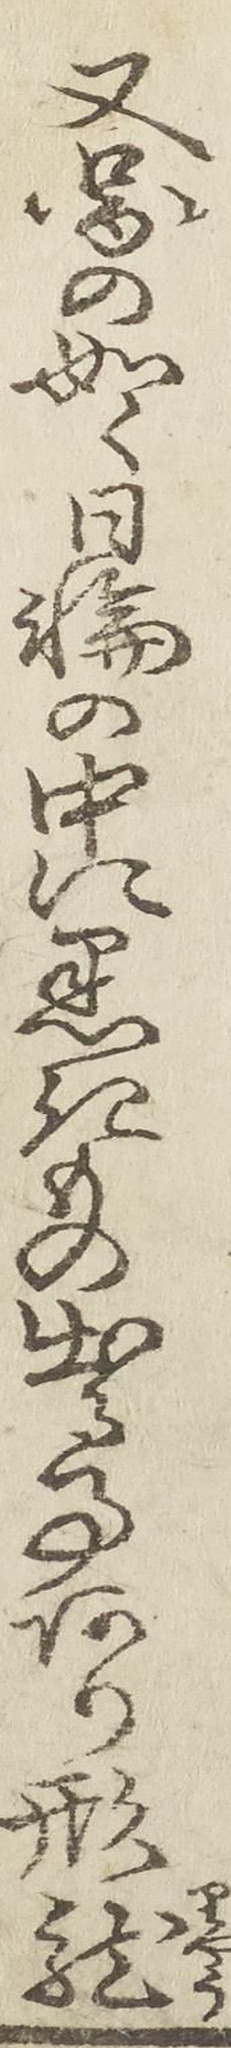又図の如く日輪の中に黒きもの出る事あり形龍
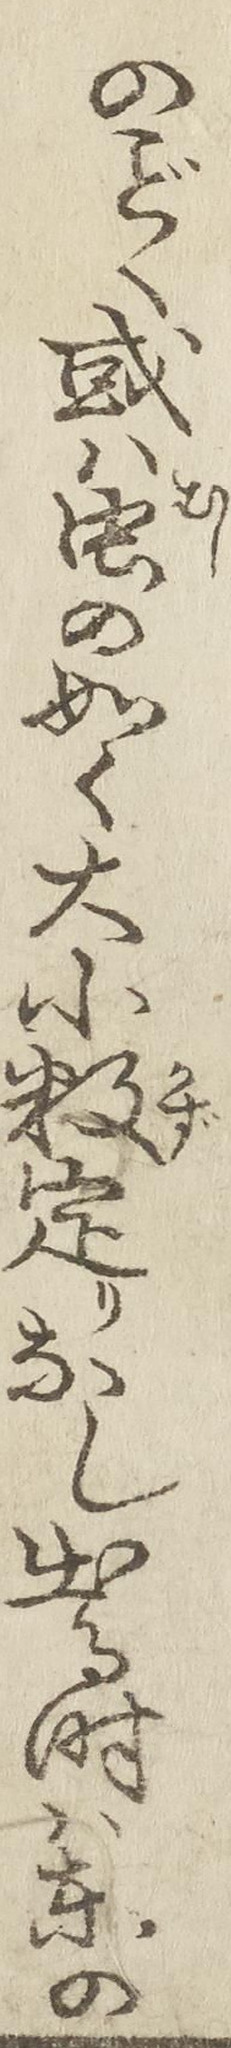のごとく或は虫の如く大小数定りなし出る時は東の
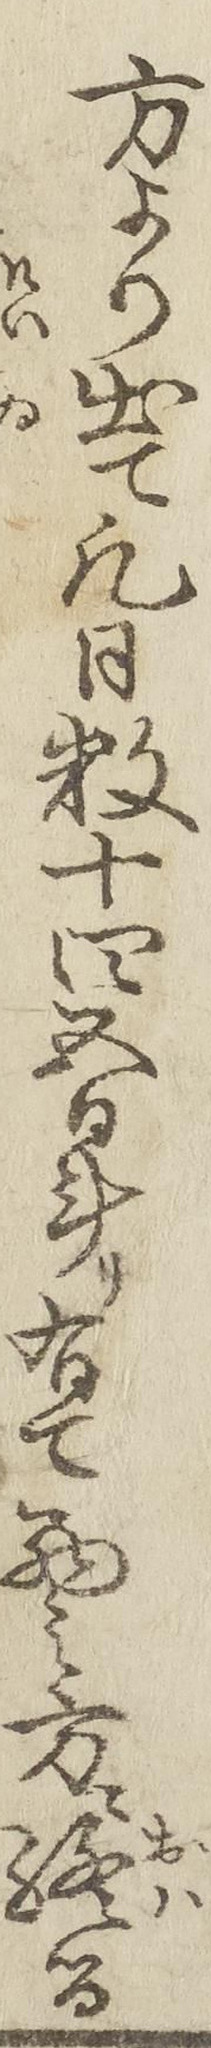方より出て凡日数十四五日計り有て西の方ニ終る
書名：平天儀圖解
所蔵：東京大学地震研究所図書室 Earthquake Research Institute Library, The University of Tokyo, JAPAN
